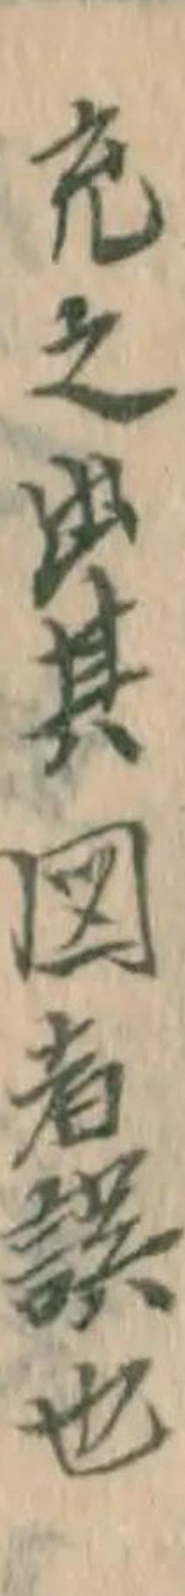充之出其図者誤也

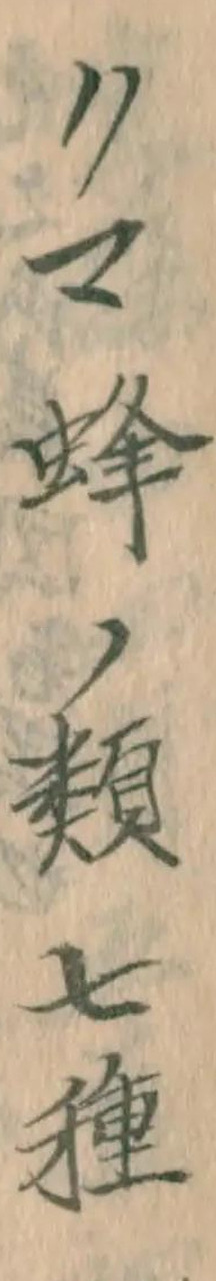クマ蜂ノ類七種

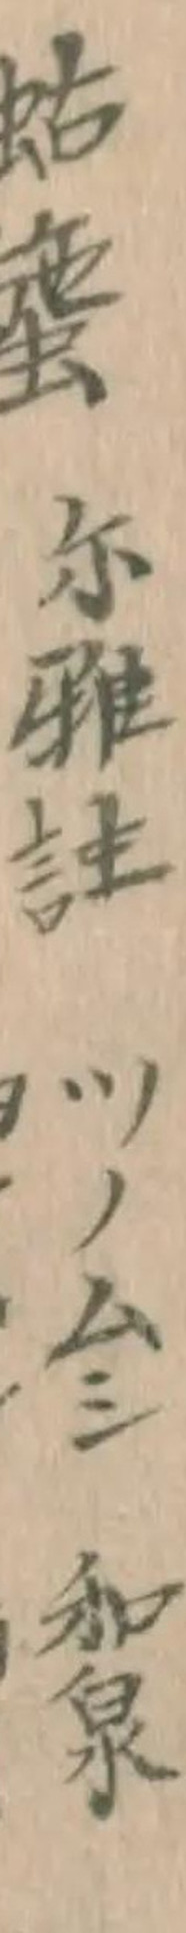蛄䗐尓雅註ツノムシ和泉
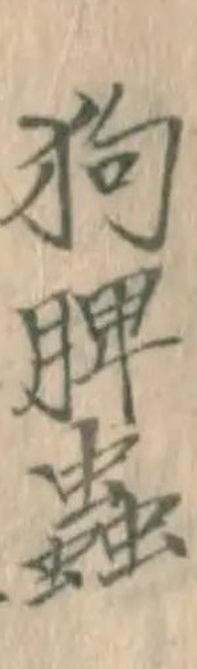狗脾蟲
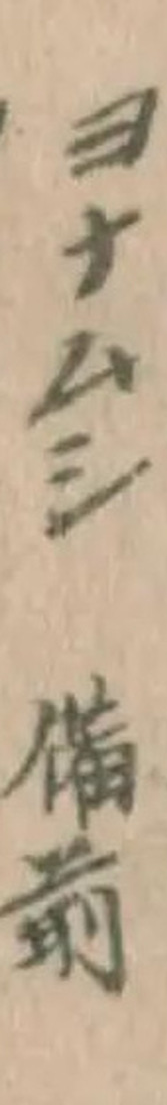ヨナムシ備前
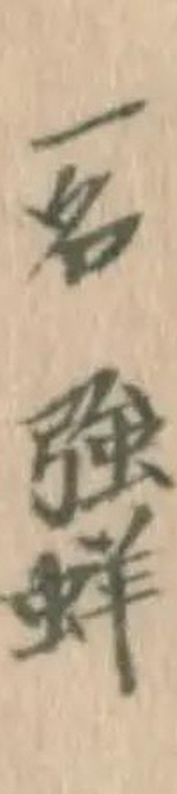一名強蛘
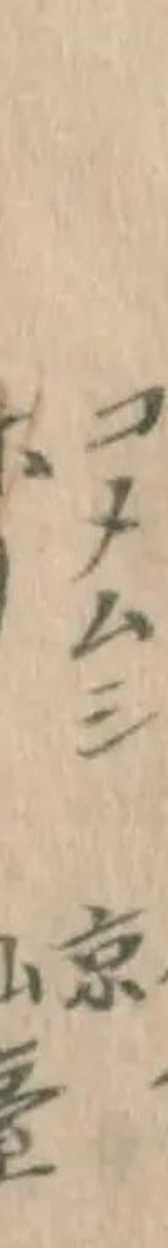コメムシ京
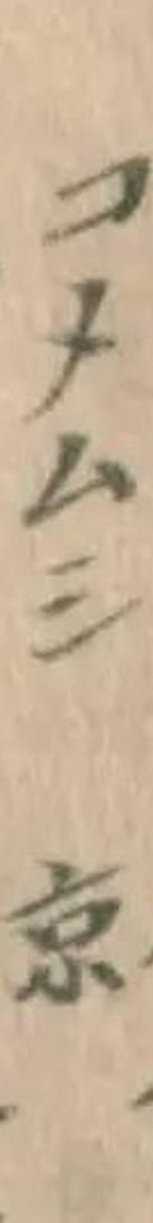コメムシ京
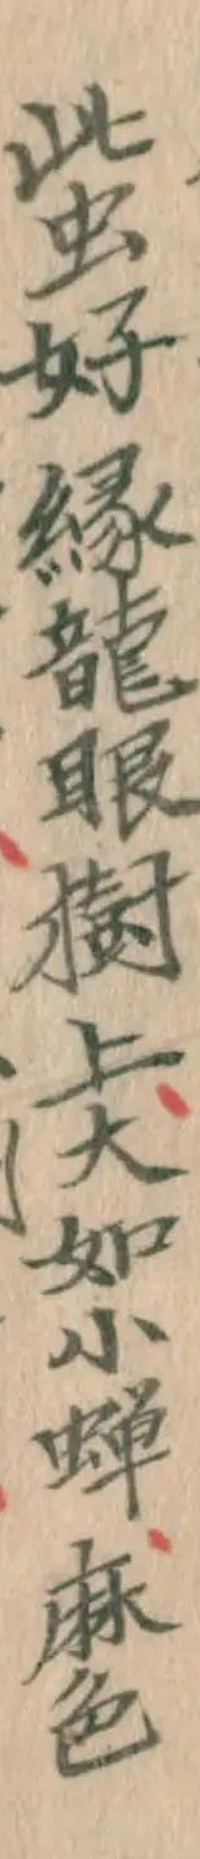此虫好縁龍眼樹上、大如小蟬、麻色
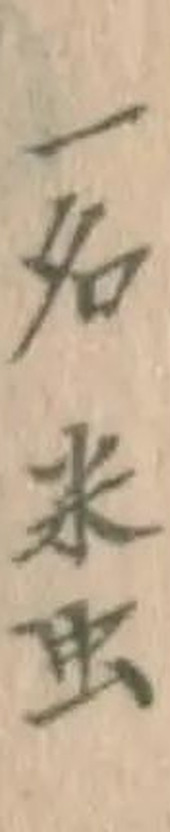一名米虫
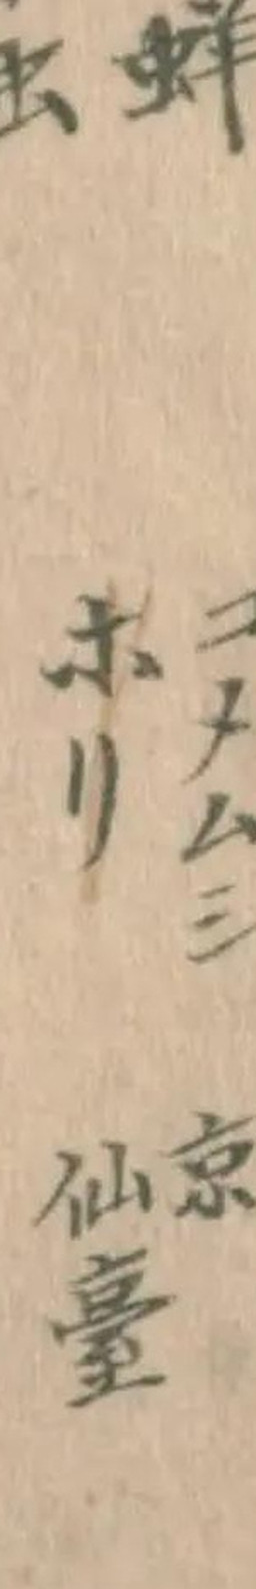ホリ仙臺
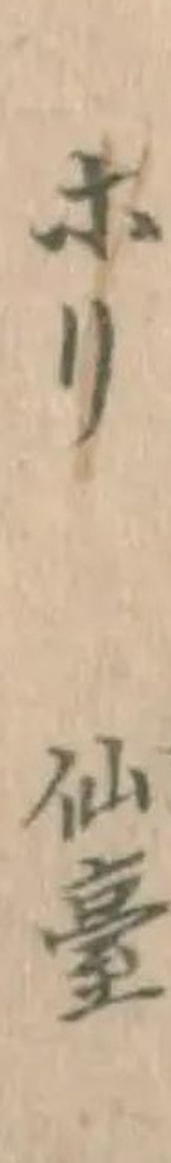ホリ仙臺
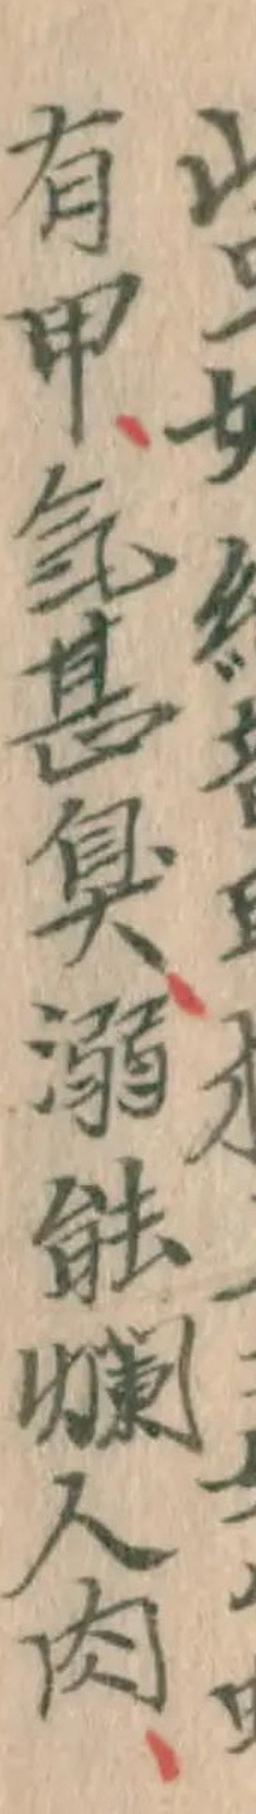有甲、気甚臭、溺能爛人肉、
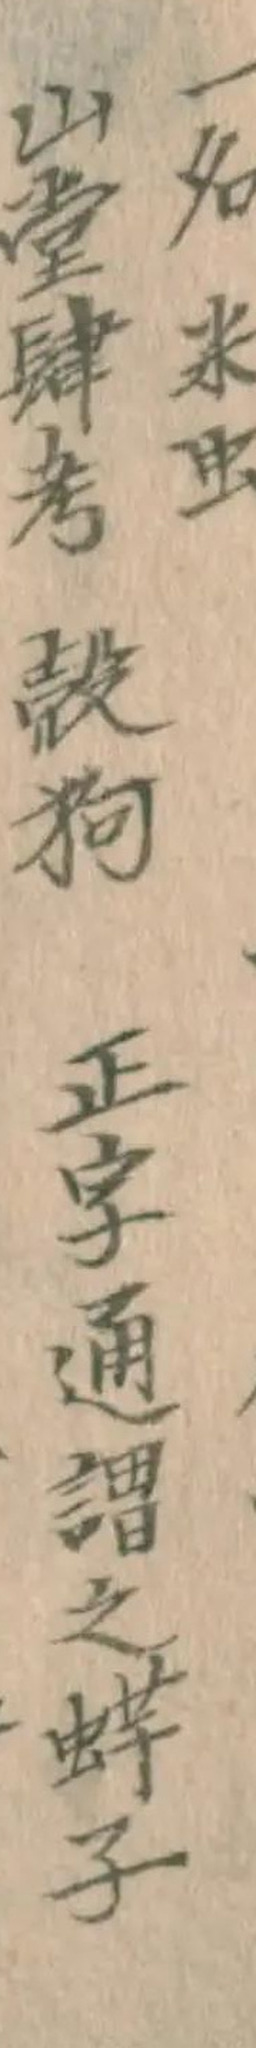山堂肆考穀狗正字通謂之蝆子
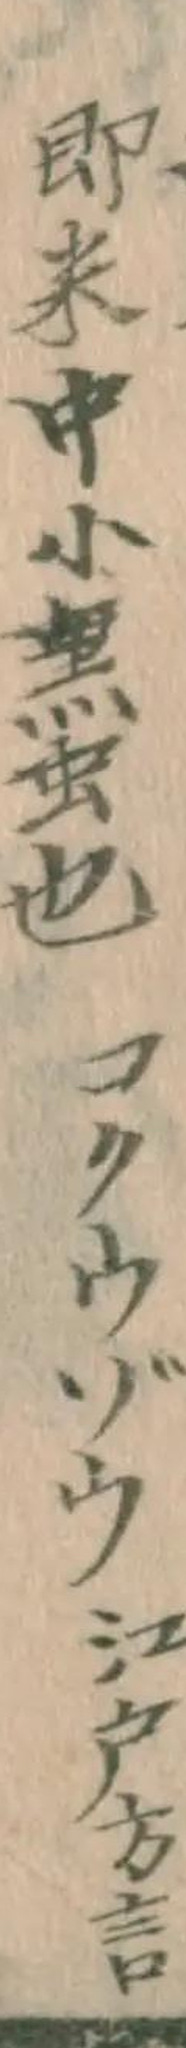即米中小黒虫也コクウゾウ江戸方言
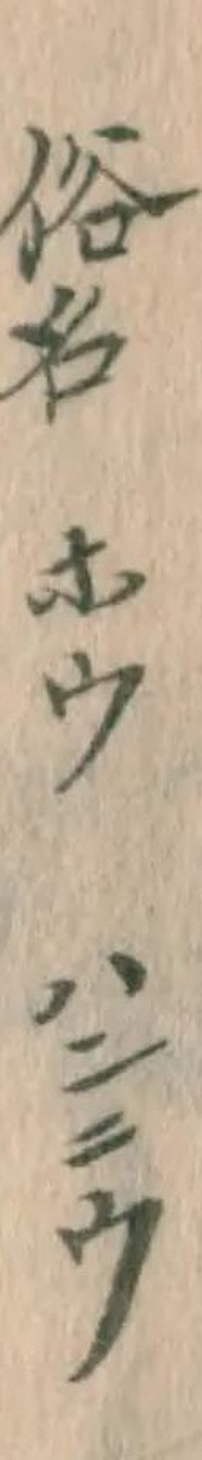俗名ホウハンニウ
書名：千蟲譜 3巻. [1]
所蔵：国立国会図書館 National Diet Library, JAPAN
